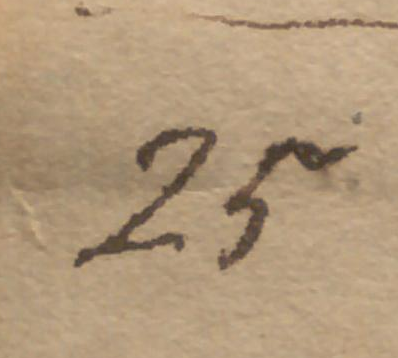25
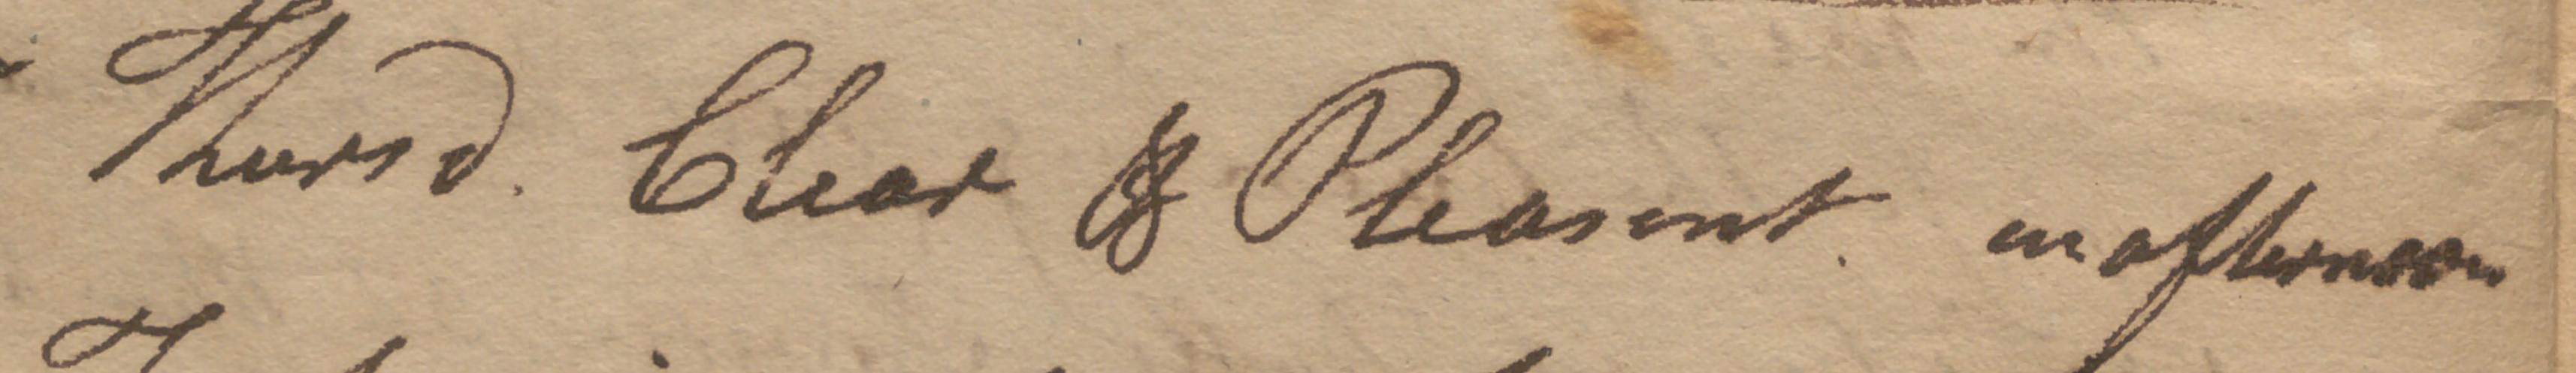Thursd. Clear & Pleasent in afternoon
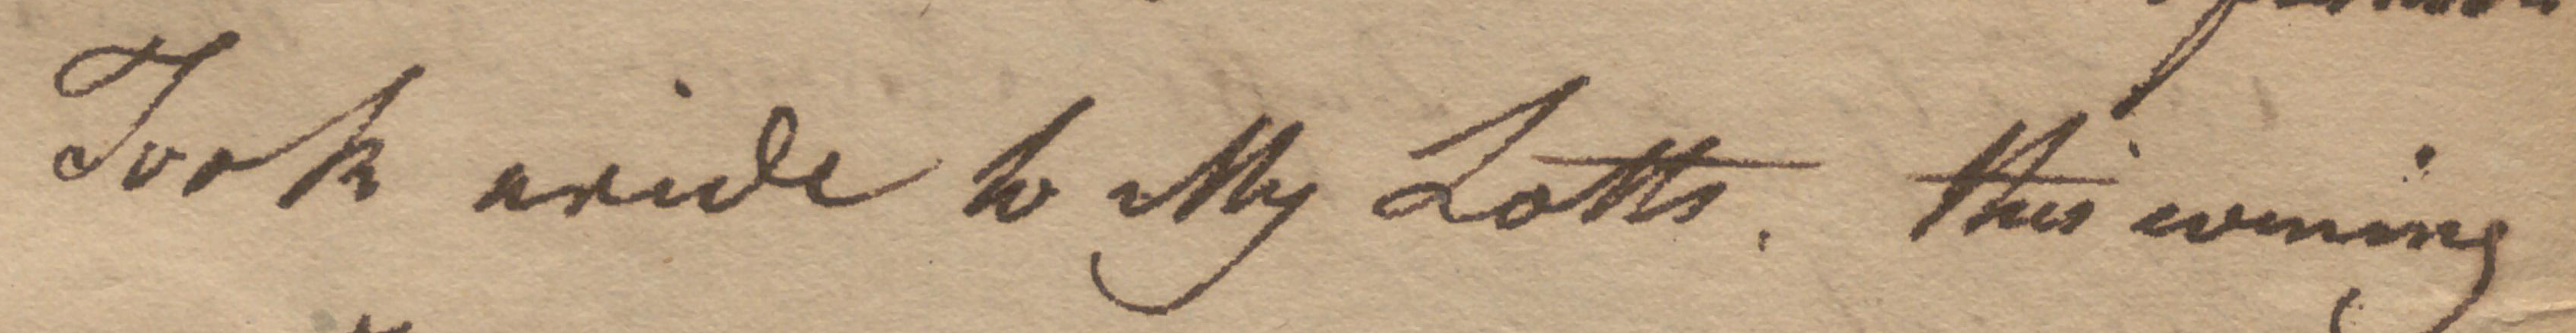Took a ride to My Lotts. this evening
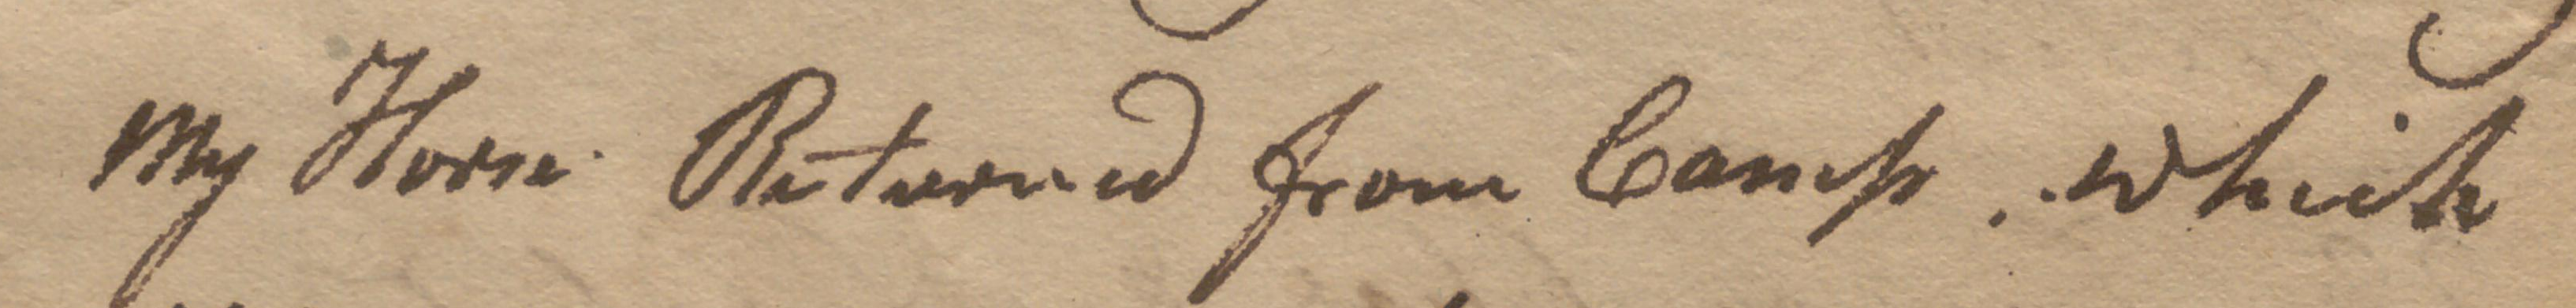My Horse Returned from Camp, which
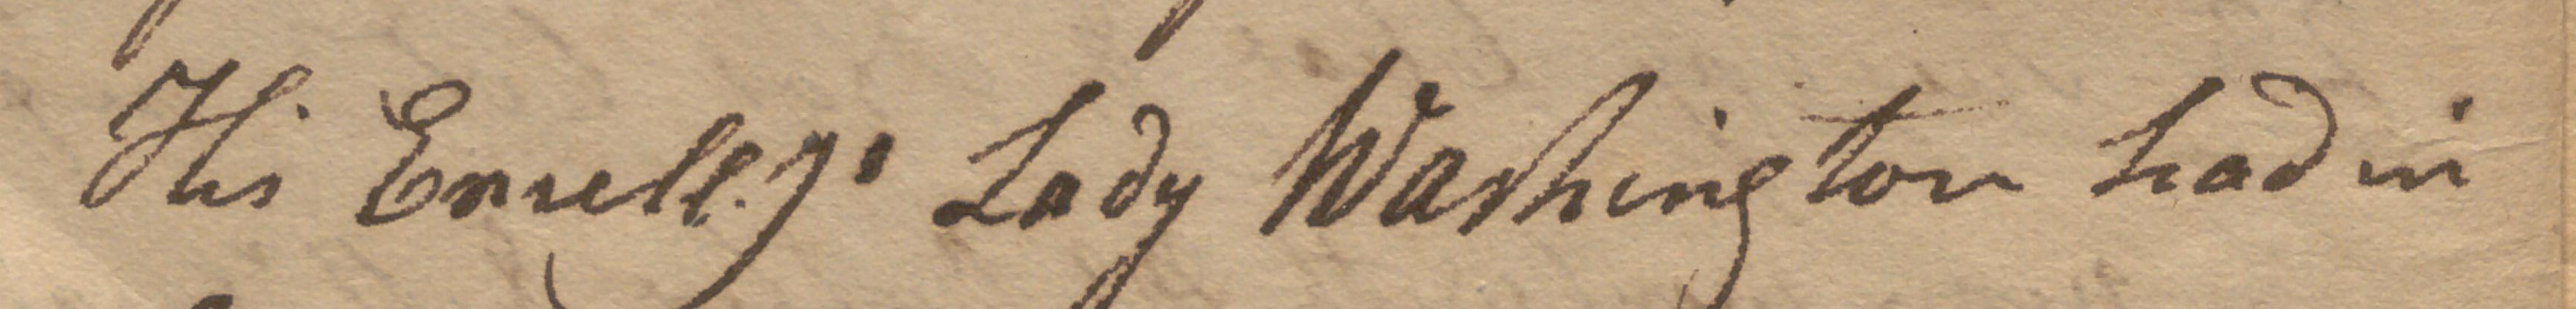His Excell^y. Lady Washington had in
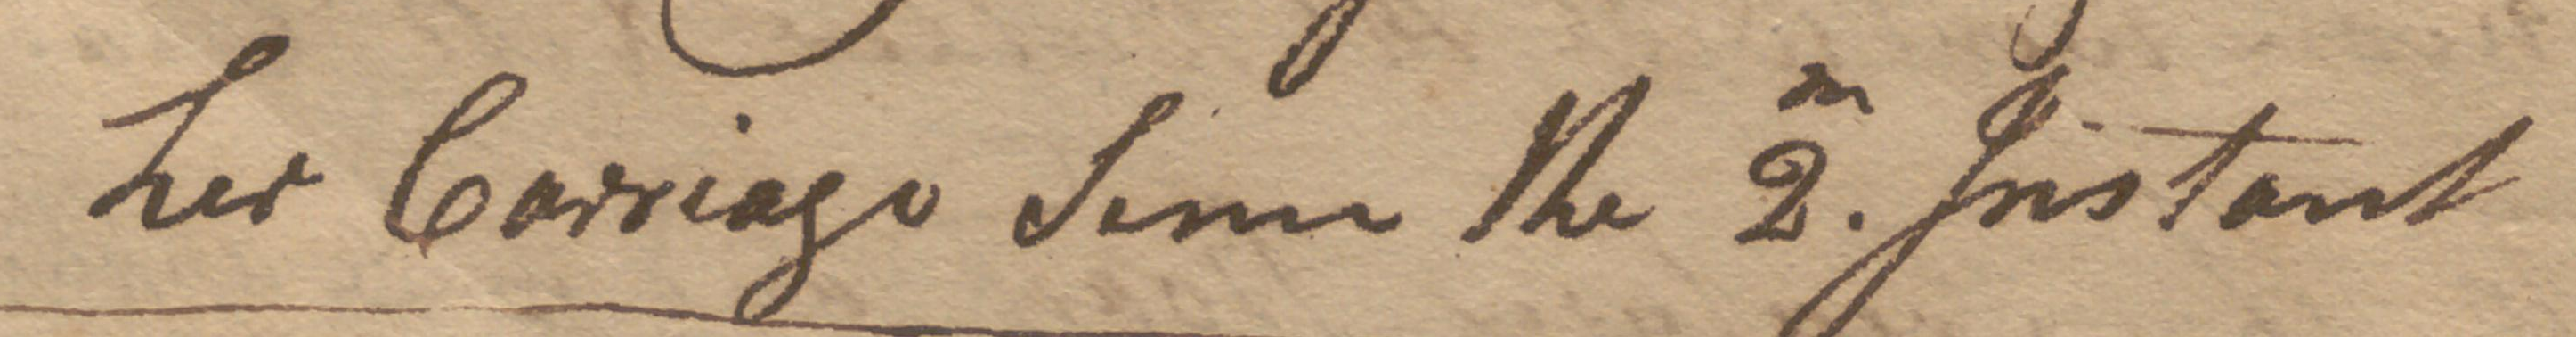her Carriage Since the 2^d. Instant
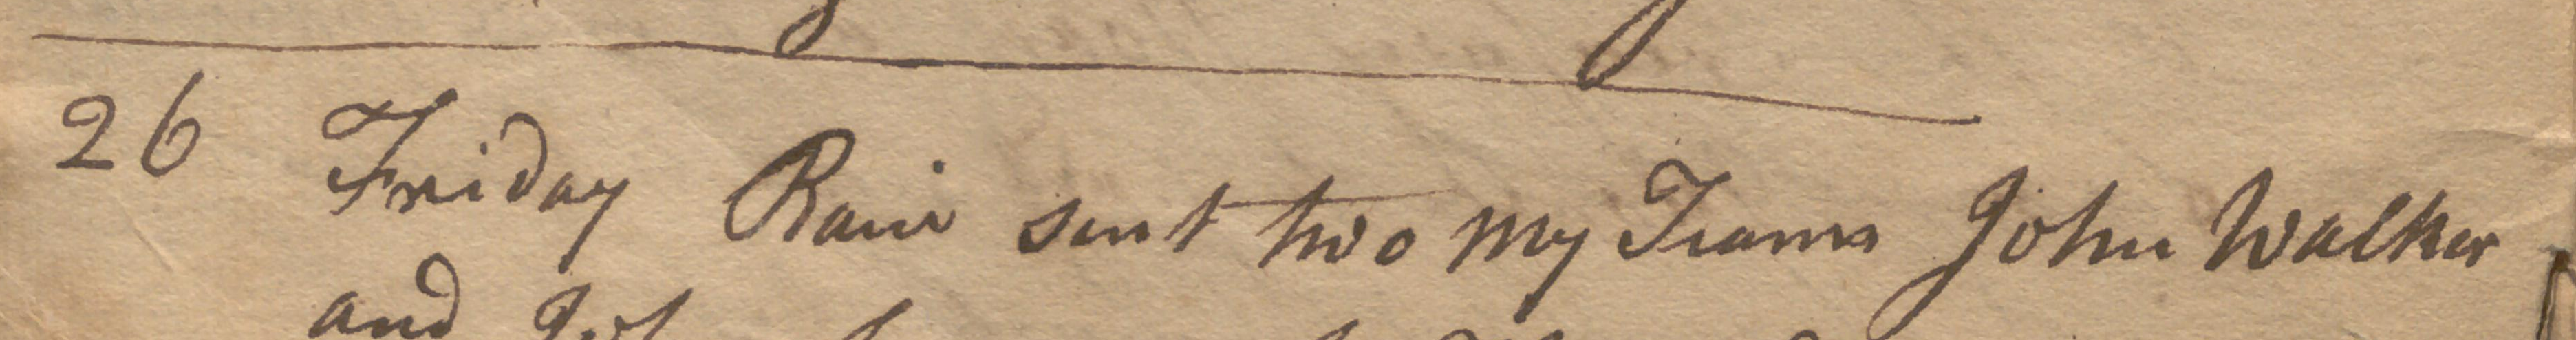26 Friday Rains sent two My Teams John Walker
